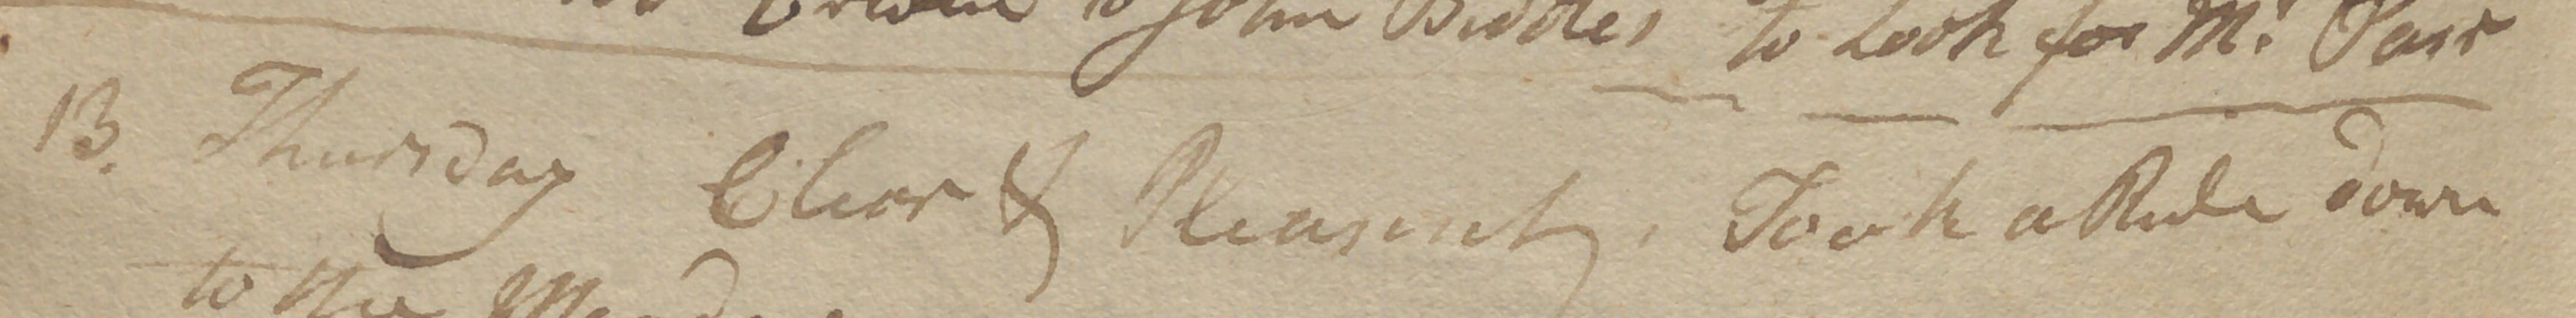13. Thursday Clear & Pleasent, Took a Ride down
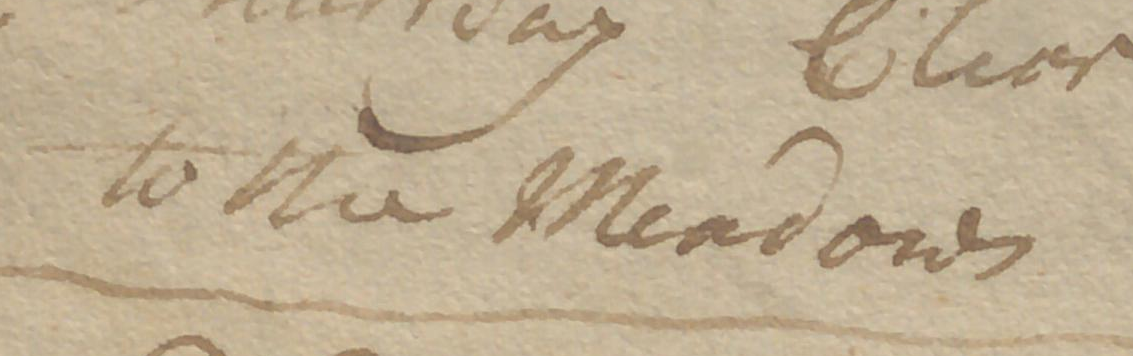to the Meadows
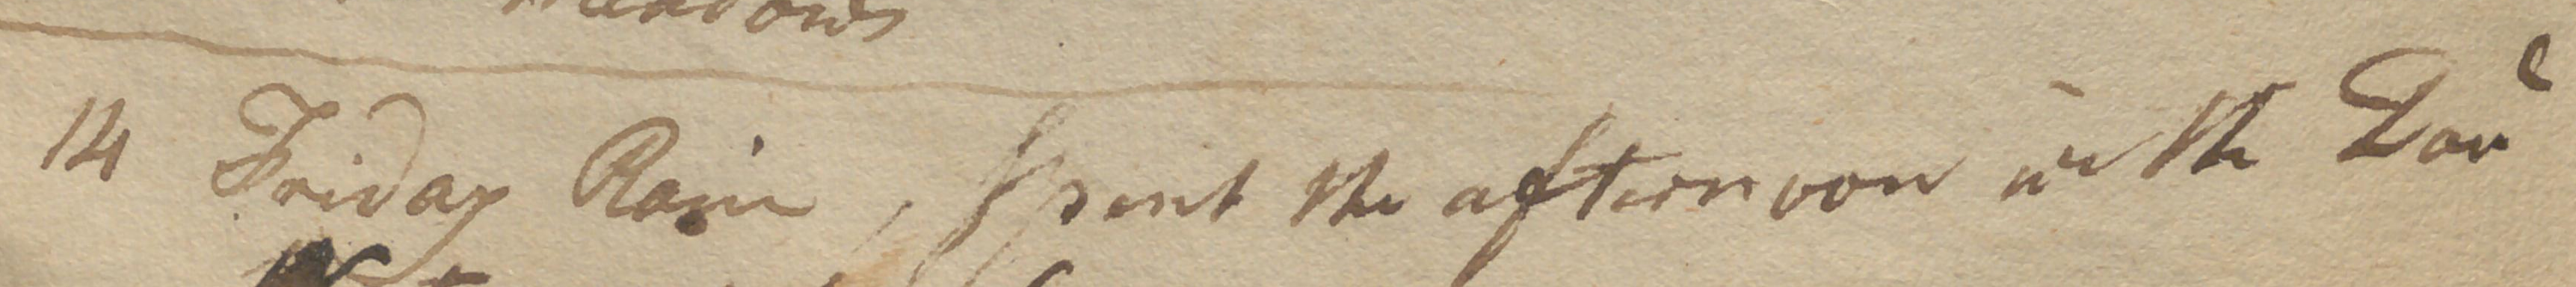14 Friday Rain, spent the afternoon with Dan^l
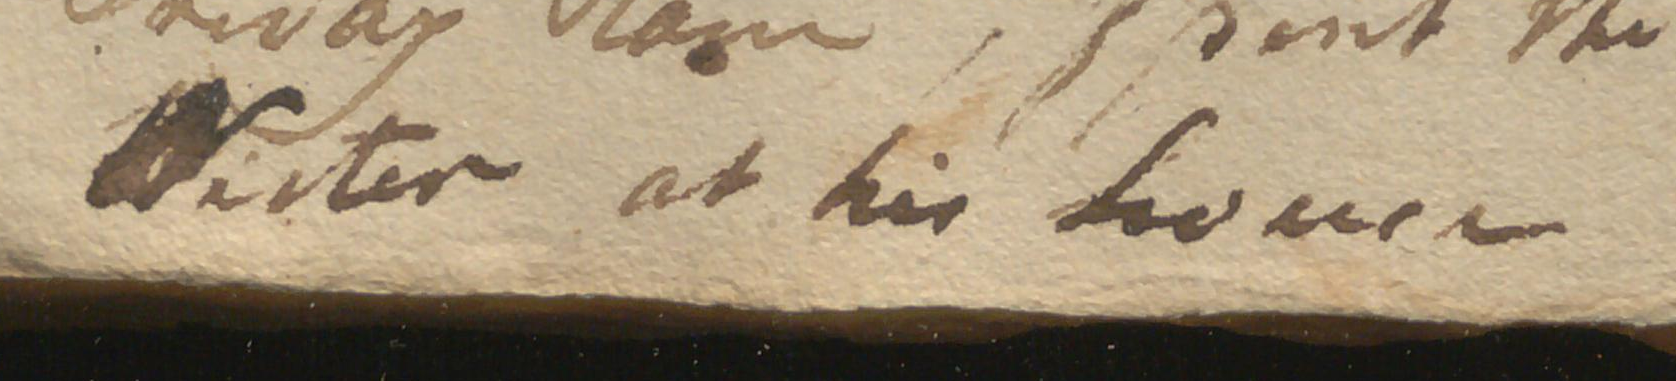Wister at his house
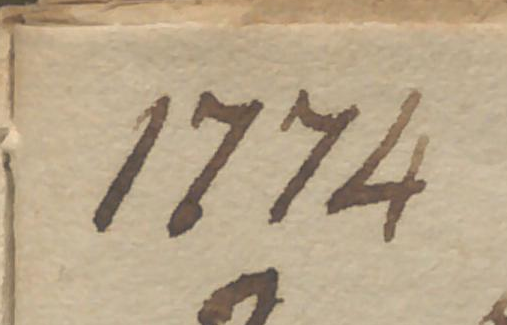1774
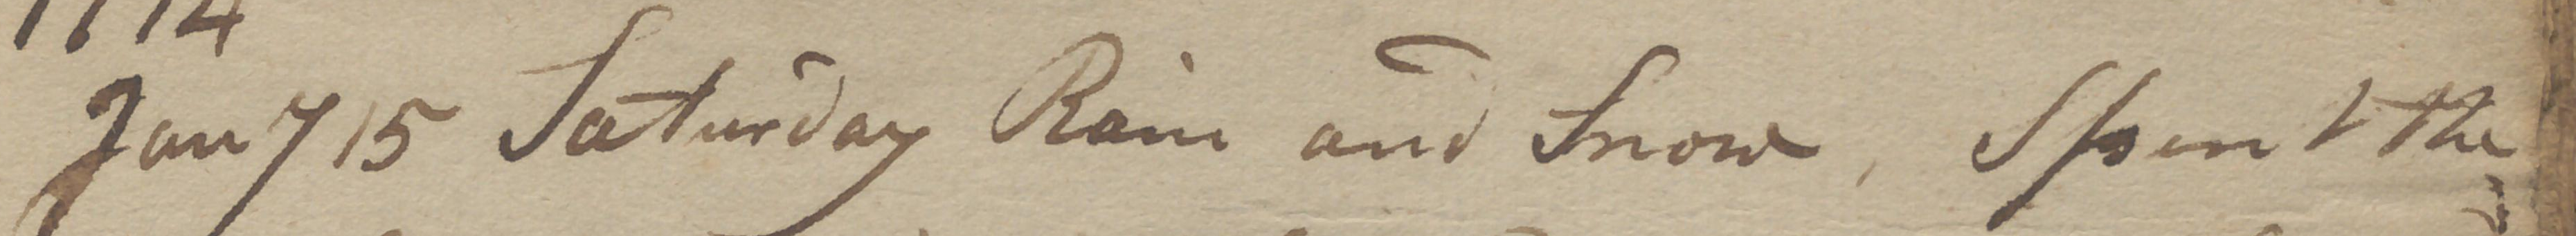Jan^y 15 Saturday Rain and Snow Spent the
